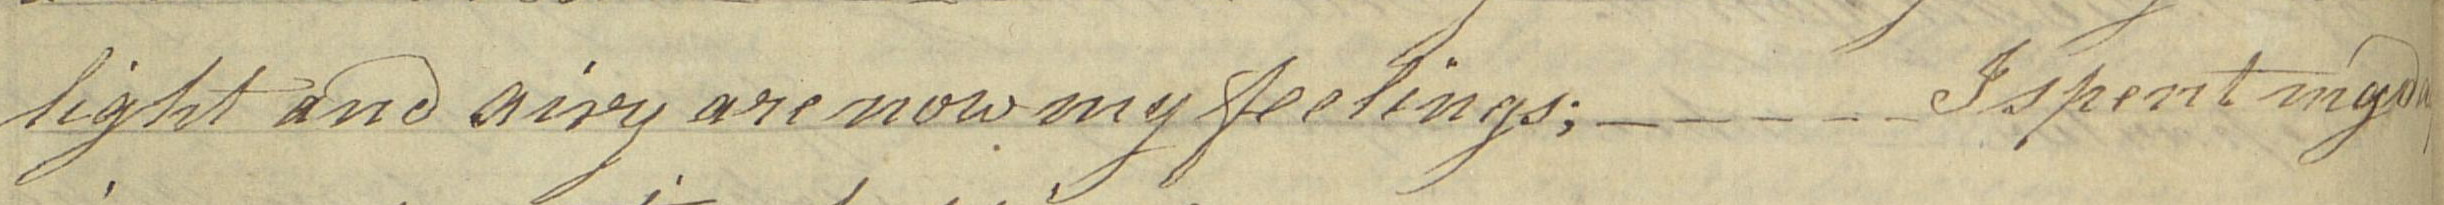Light and airy are now my feelings; I spent my day
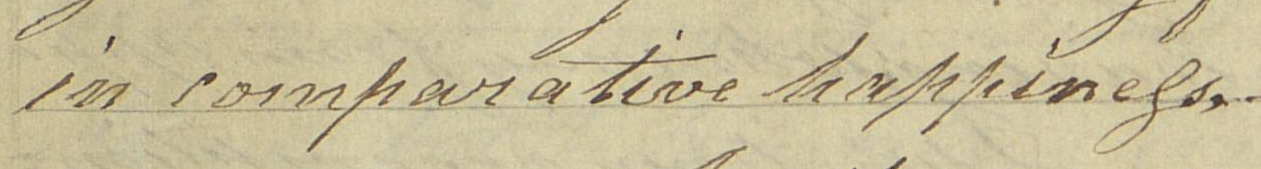in comparative happiness.
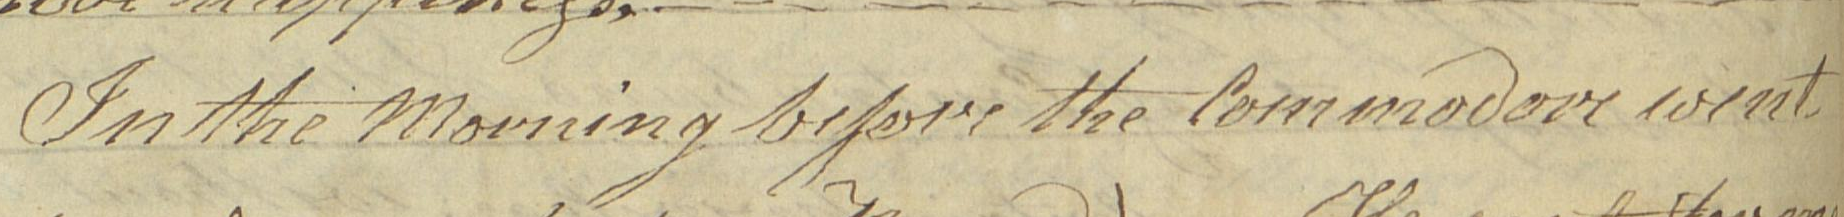In the Morning before the Commodore went
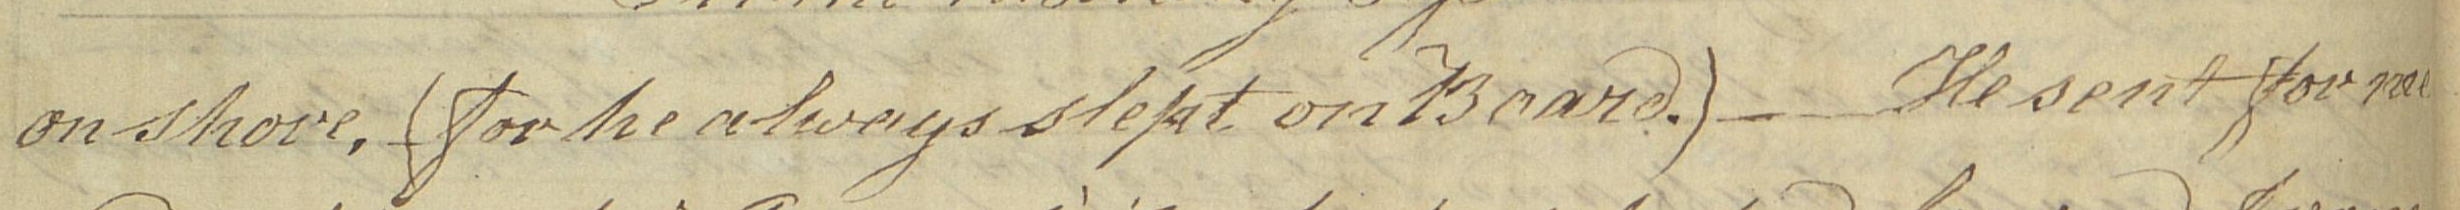on shove, (for he always slept on Beard.) He sent for me
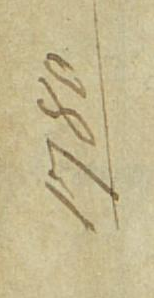1780
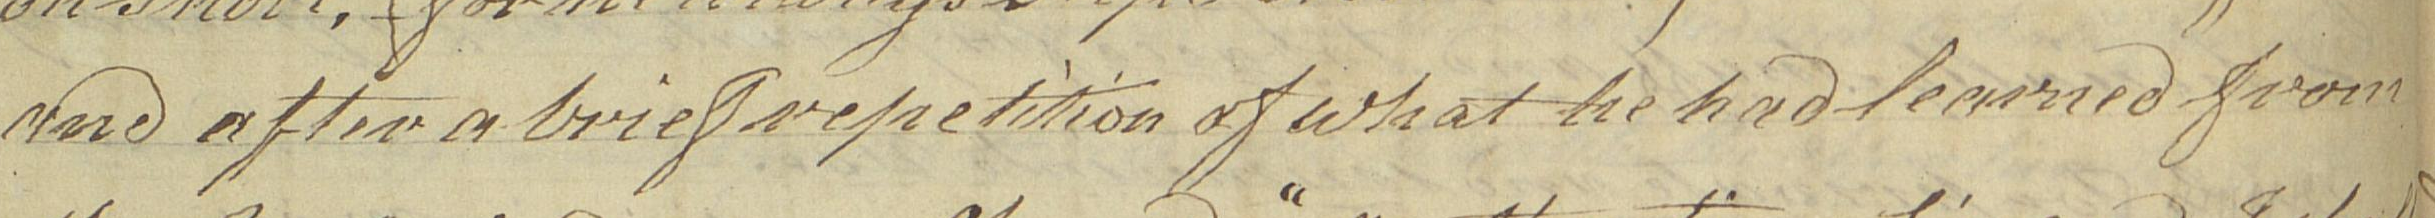and after a brief repetition of what he had learned from
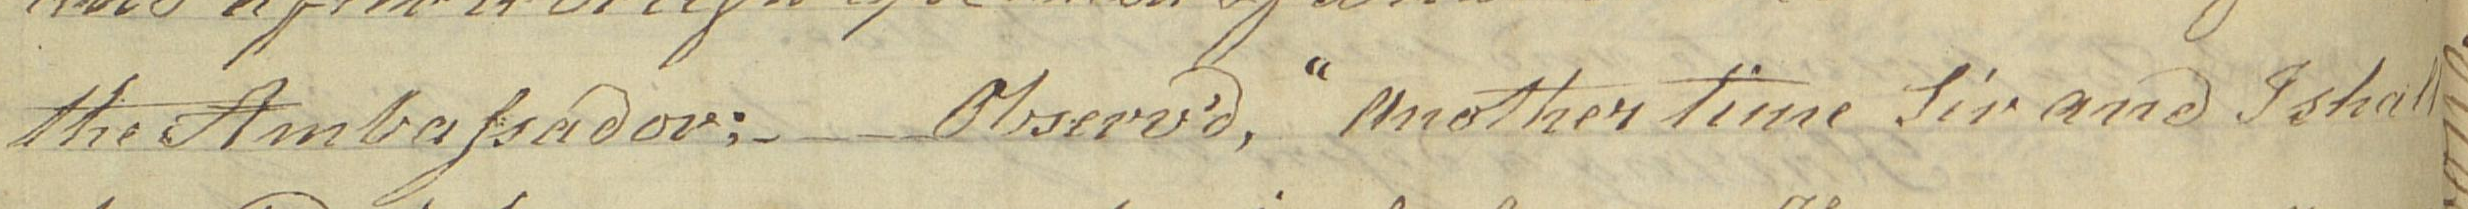the Ambassador; Obsevrv'd, "mother time sir and I shall
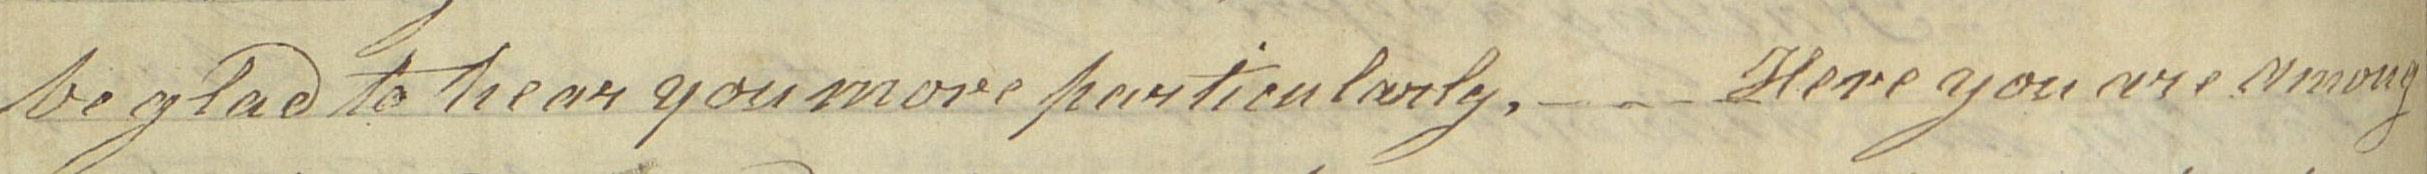be glad to hear you more particularly, Here you are among
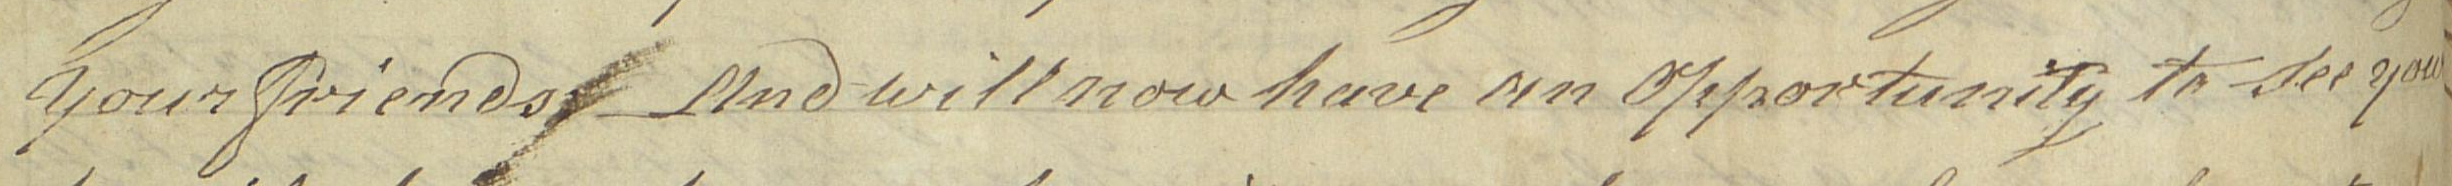Your friends And will now have an opportunity to see you
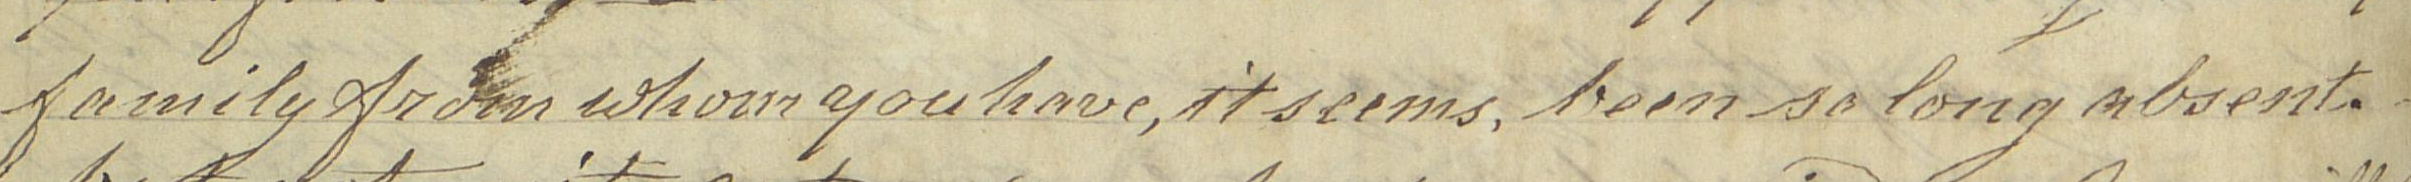family from whom you have, it seems been so long absent.
